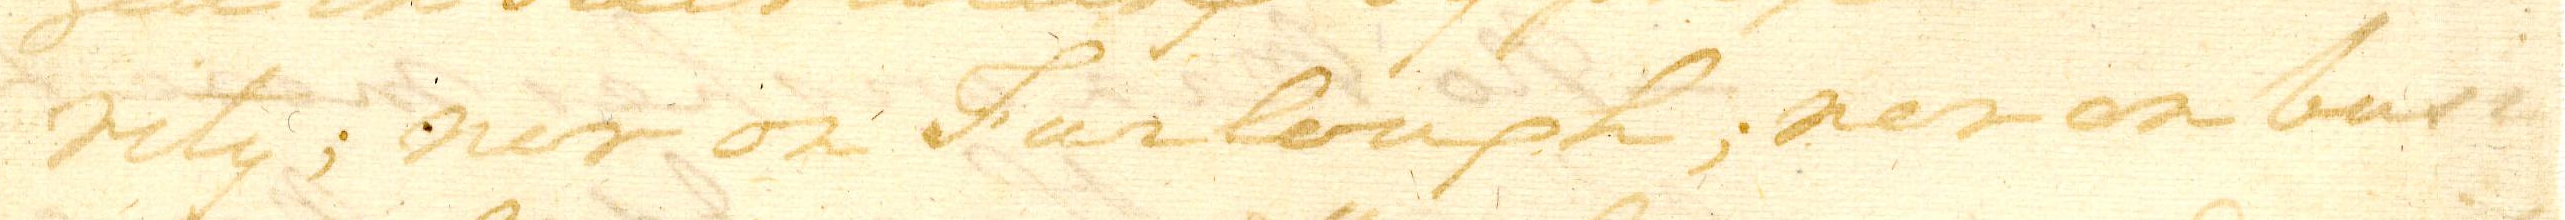rity; nor on Furlough; nor on busi
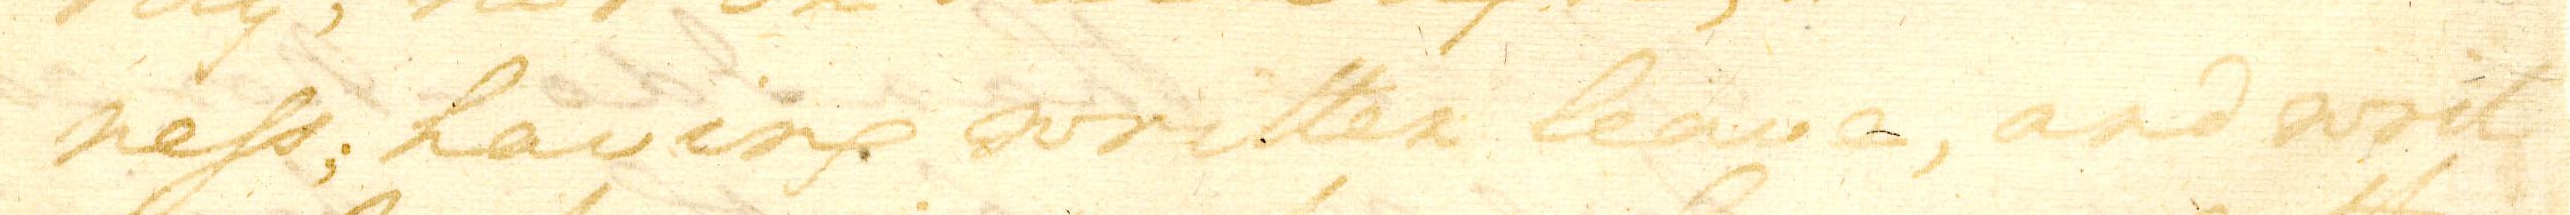ness; having written leave, and writ
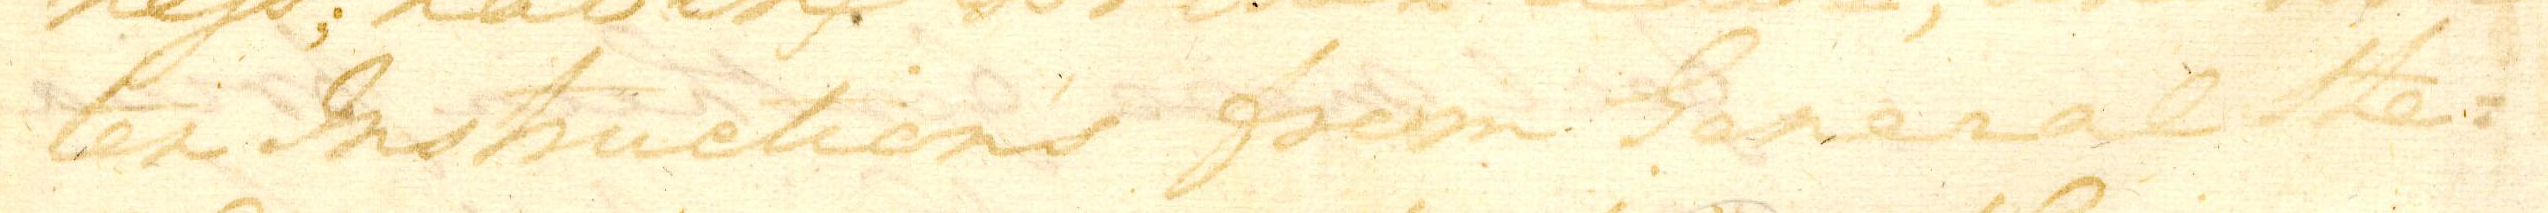ten Instructions from General Ste-
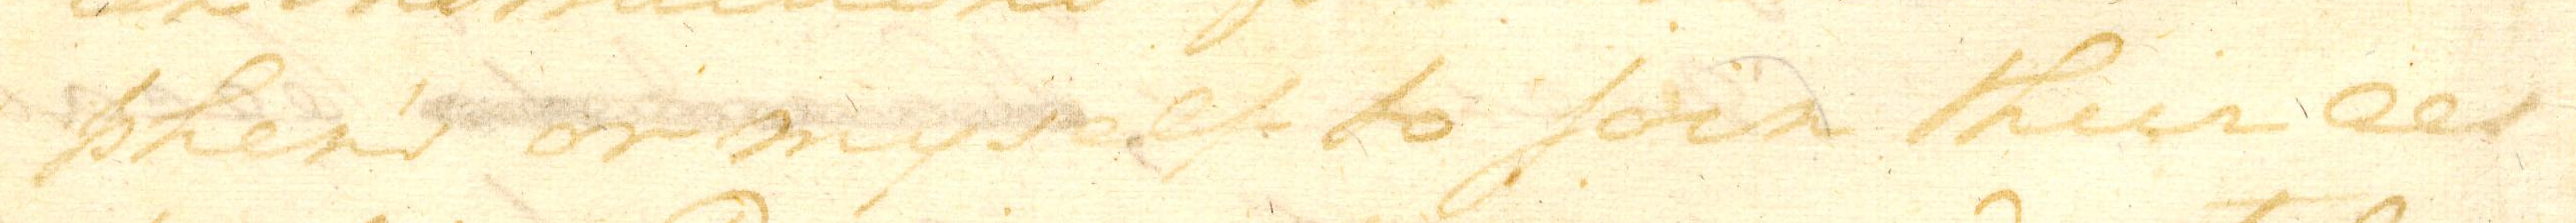phen's or myself to join their res
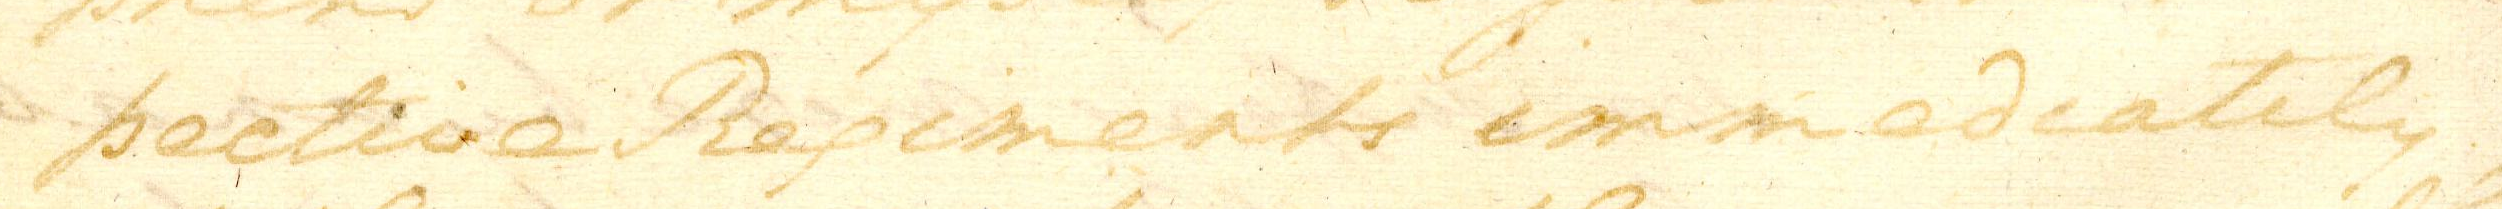pective Regiments immediately
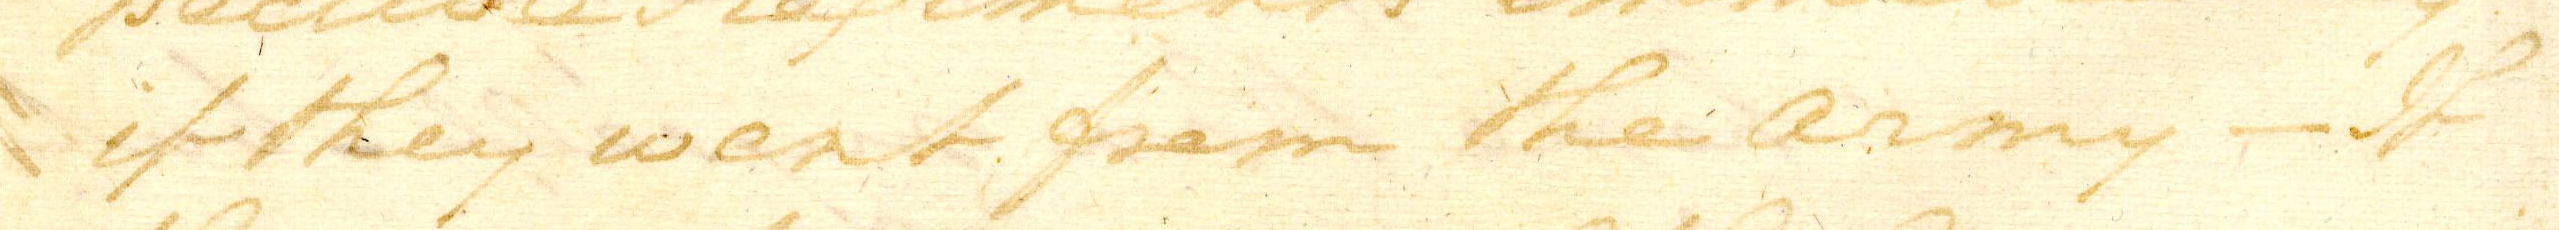if they went from the army- If
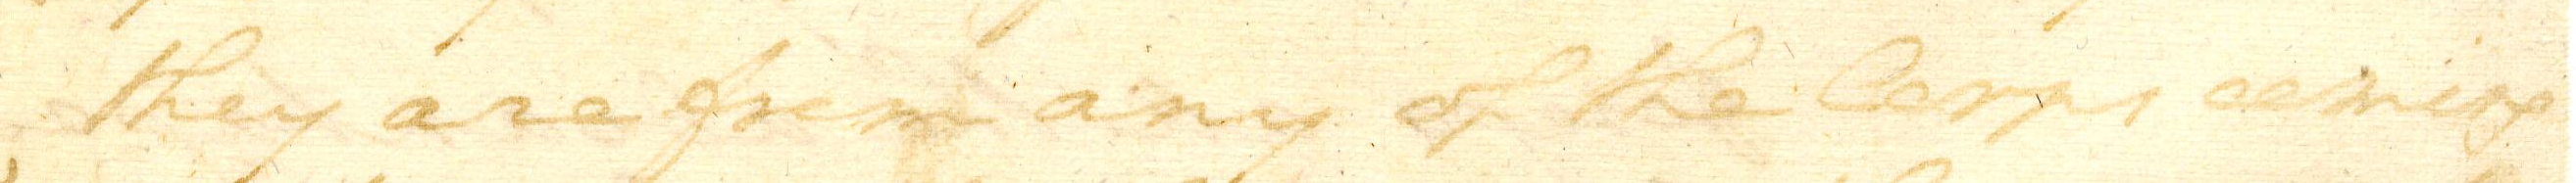they are from any of the Corps coming
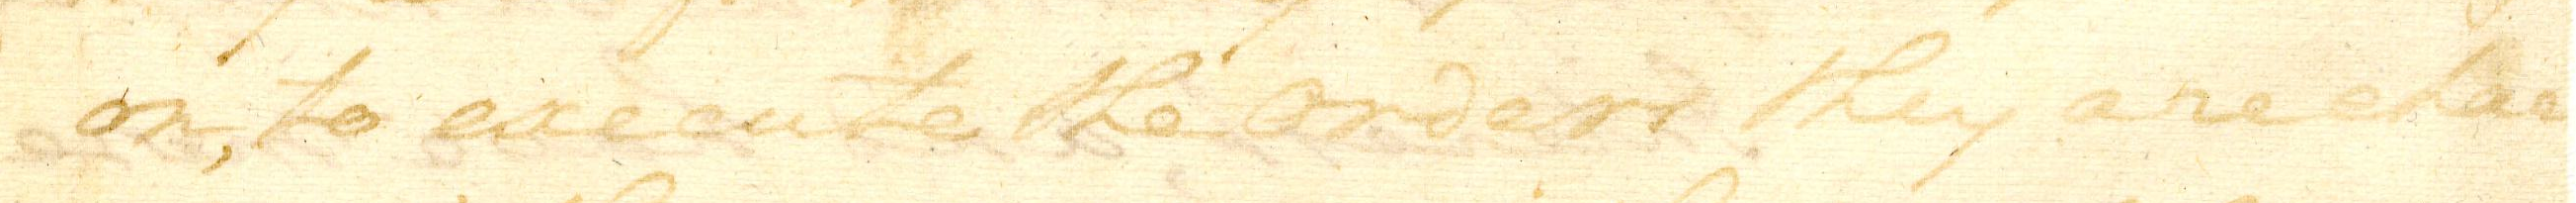on, to execute the orders they are char
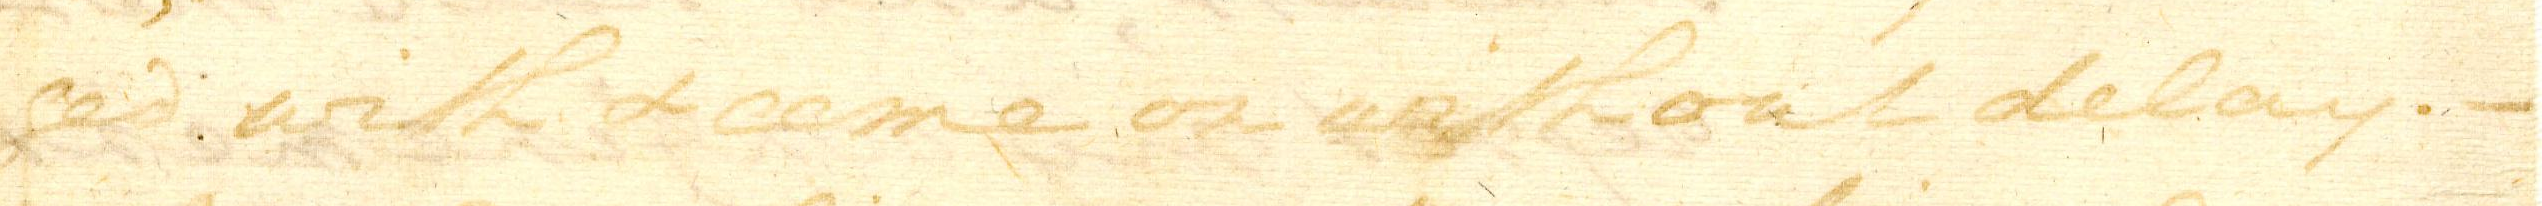ged with & come on without delay.-
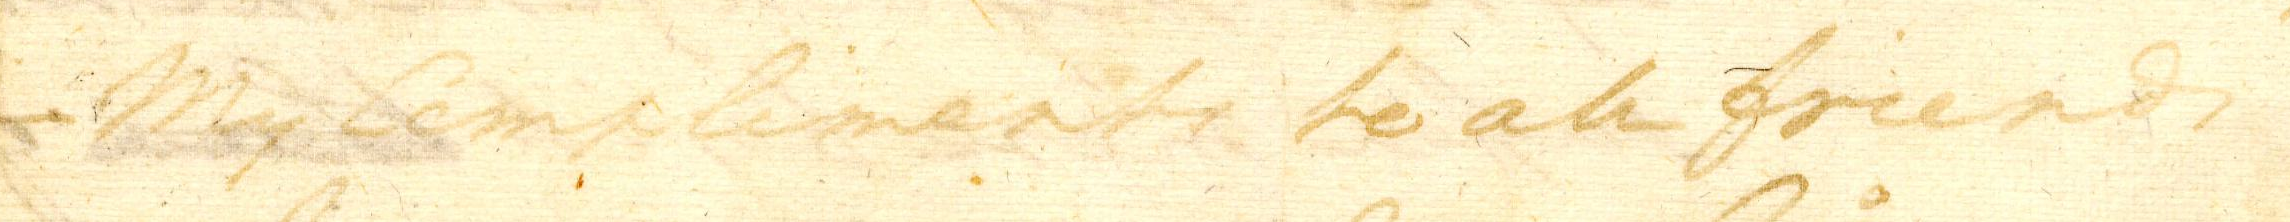My Compliments to all friends
